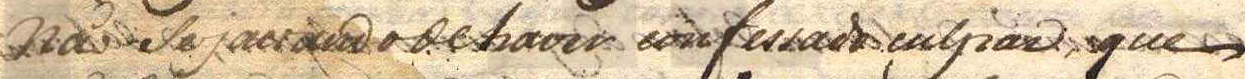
naõ se jactando de haver confessado culpas, que
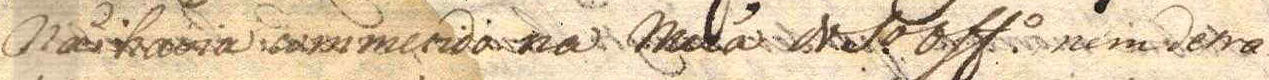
naõ havia commetido na mesa do s.o off.o nem de tra
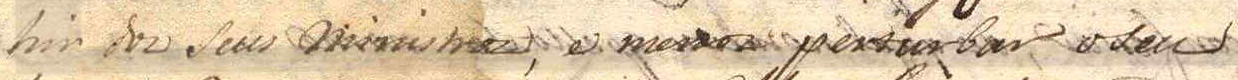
hir dos seus ministros, e menos perturbar o seu
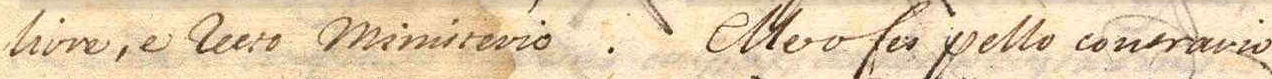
livre, e Recto ministerio. Elle o fes pelo contrario
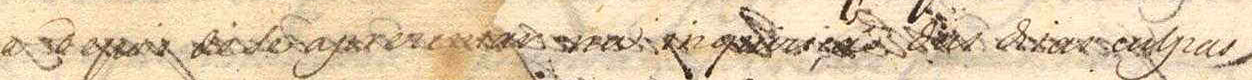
e depois de se aprezentar na inquiziçaõ das ditas culpas
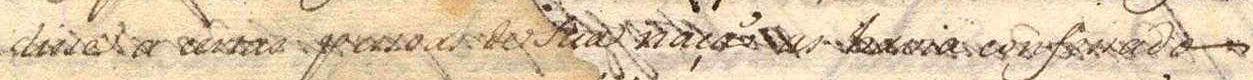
disse a certas pessoas de sua naçaõ as havia confessado
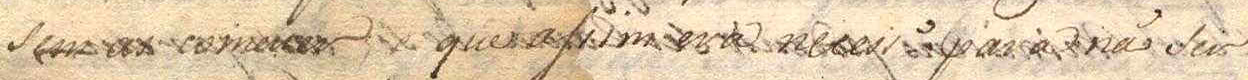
sem as cometer, e que assim era necess.o para não ser
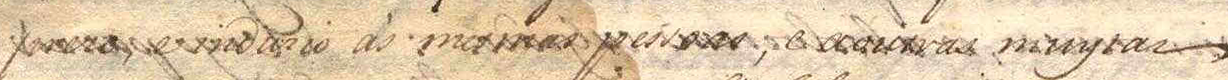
prezo, e induzio as mesmas pessoas, e a outras muytas
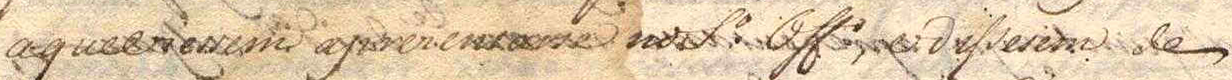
a que viessem aprezentarse no S.o Off.o, e dissesem de
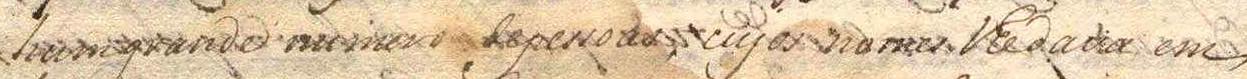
hum grande numero de pessoas, cujos nomes lhe daria em
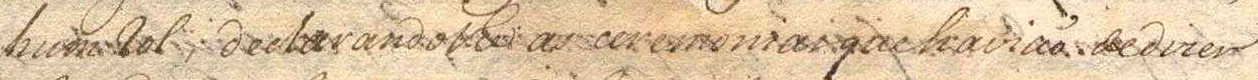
hum Rol, declarandolhe as ceremonias que haviaõ de dizer
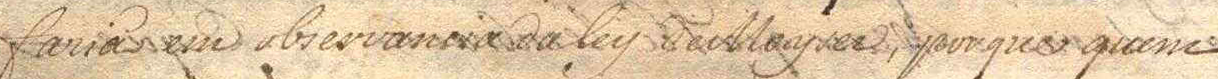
fariaõ em observancia da ley de Moysez, porque quem
